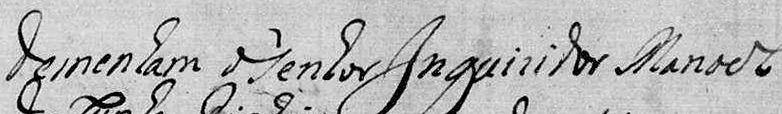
de menham o senhor Jnquisidor Manoel
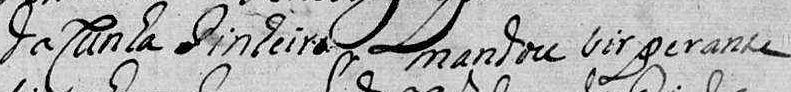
da Cunha Pinheiro mandou vir perante
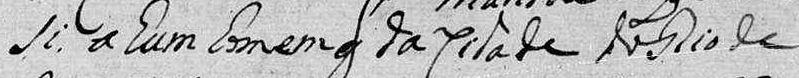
si, a hum homem q̄ da Cidade do Rio de
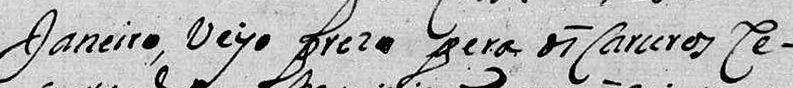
Janeiro, veyo prezo pera os Carceres Ce
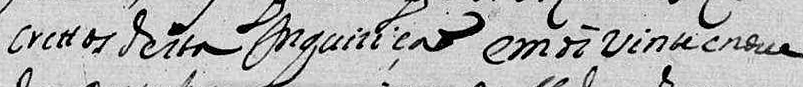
crettos desta Jnquisiçaõ em os vinte e noue
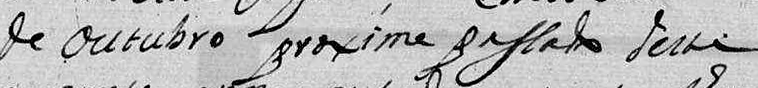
de outubro proxime passado deste
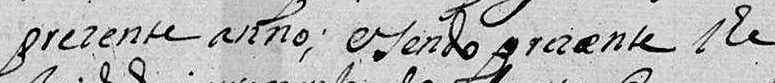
prezente anno; e sendo prezente lhe
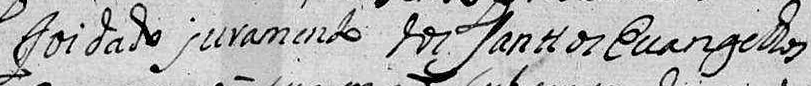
foi dado juramento dos Santtos Euangelhos
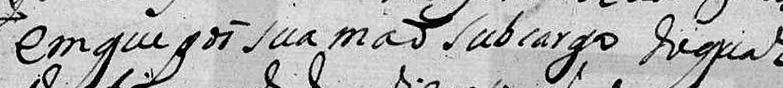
em que pos sua maõ sub cargo do qual
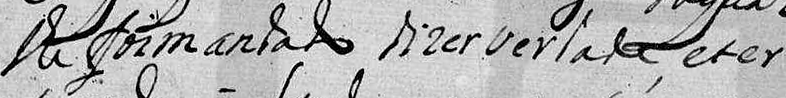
lhe foi mandado dizer verdade, e ter
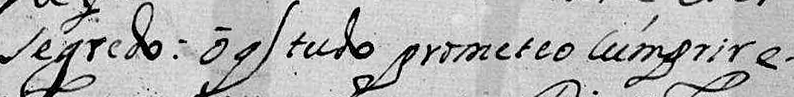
segredo: o q̄ tudo prometeo cumprir e
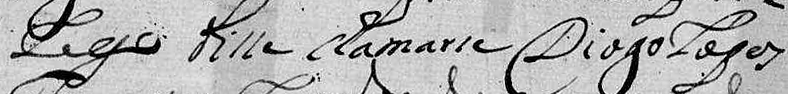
Logo disse chamarse Diogo Lopes
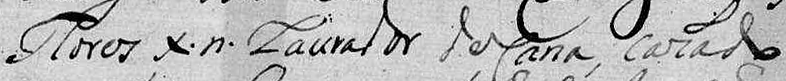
Flores x. n. Laurador de Cana cazado
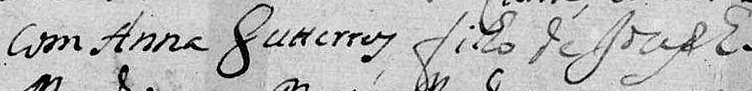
com Anna Gutterres, filho de Jozeph
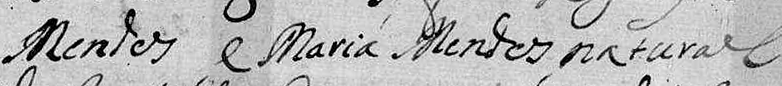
Mendes, e Maria Mendes, natural
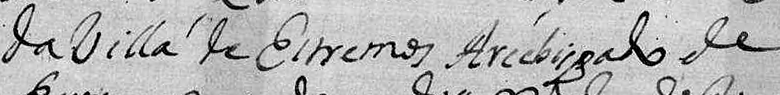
da Villa de Estremos Arcebispado de
